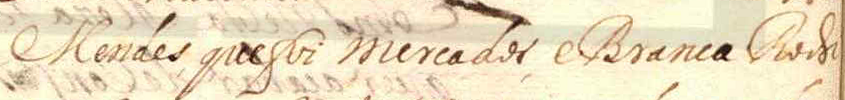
Mendes, que foi mercador, e Branca Rodri
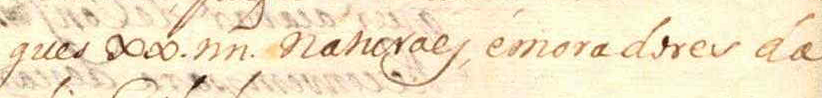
gues xx. nn. naturaes, e moradores da
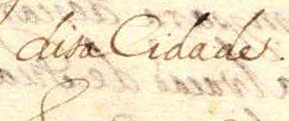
dita Cidade.
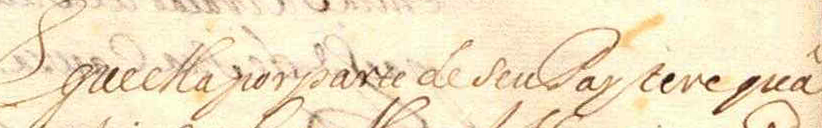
E que ella por parte de seu Pay teve qua
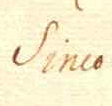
Sinco
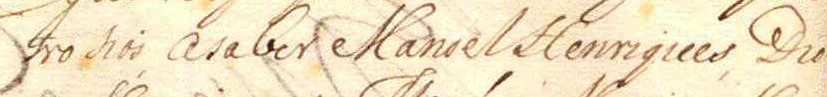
tro tios, a saber Manoel Henriques, Dio
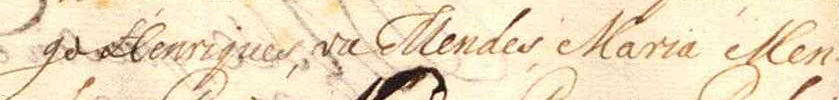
go Henriques, va Mendes, Maria Men
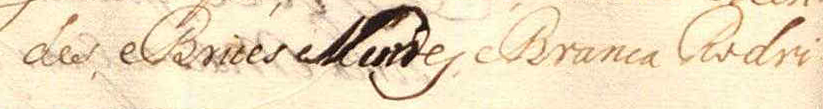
des, e Brites Mendes, e Branca Rodri
